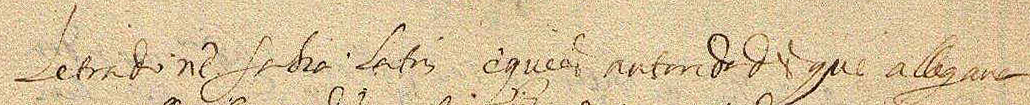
Letrado nē sabia Latim e que as autoridades que allegaua
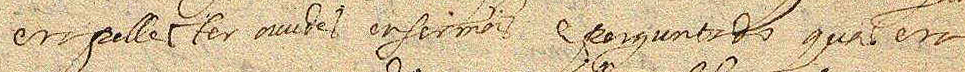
era pollas ter ouuidas en sermõis e perguntado qual era
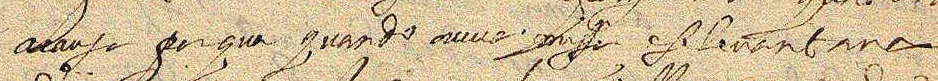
a causa por qua quando ouuia missa e se leuantaua
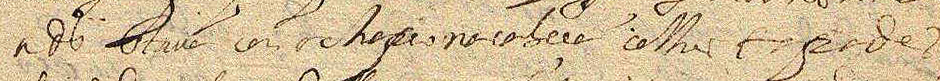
a ds̄ estaua com o chapeo na cabeça e olhos tapados
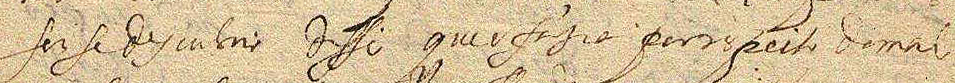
sem se descubrir disse que o fazia por respeito do mal
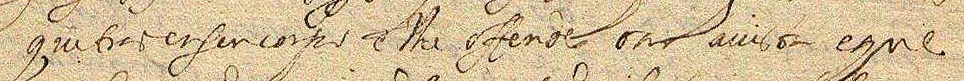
que tras en seu corpo e lhe offende o uer a uista e que
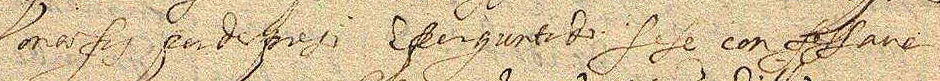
o naõ fez por despreso E perguntado se se confessaua
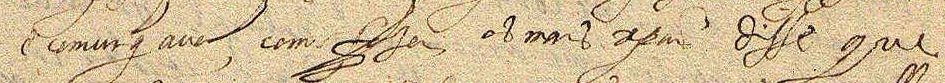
e comungaua como fasem os mais xpaõs disse que
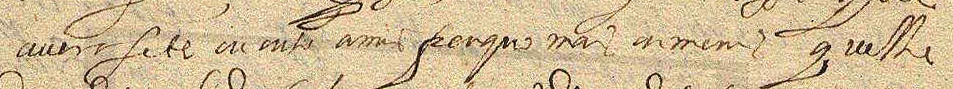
auera sete ou outo annos pouquo mais ou menos que lhe
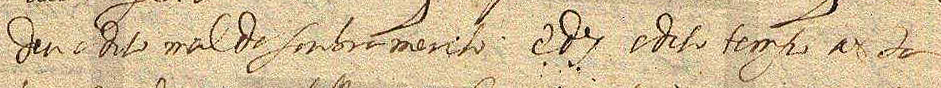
deu o dito mal dasombramento e des o dito tempo a esta
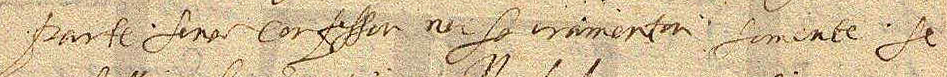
parte se naõ confessou nem sacramentou somente se
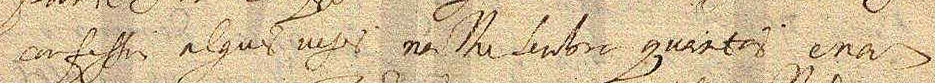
confessou alguas̄ uezes naõ lhe lembra quantas e naõ
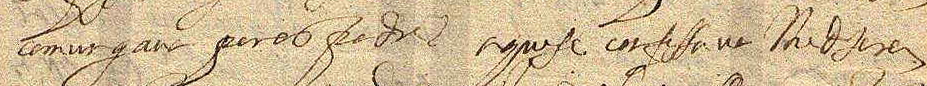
comungaua por os padres a que se confessaua lhe dizerem
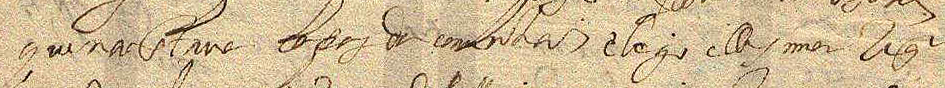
que naõ estaua capas da comunhaõ e logo elle snnor Vigro
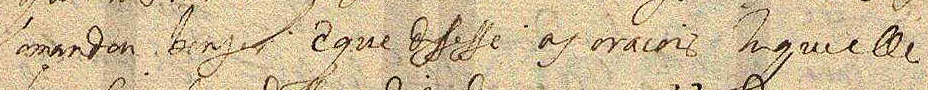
o mandou benzer e que dissesse as oraçois ho que elle
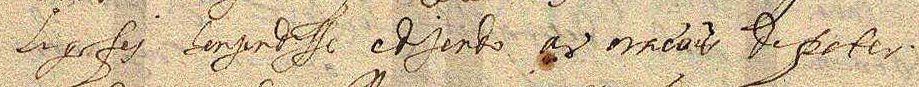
logo fes benzendosse e dizendo as oraçõis de pater
